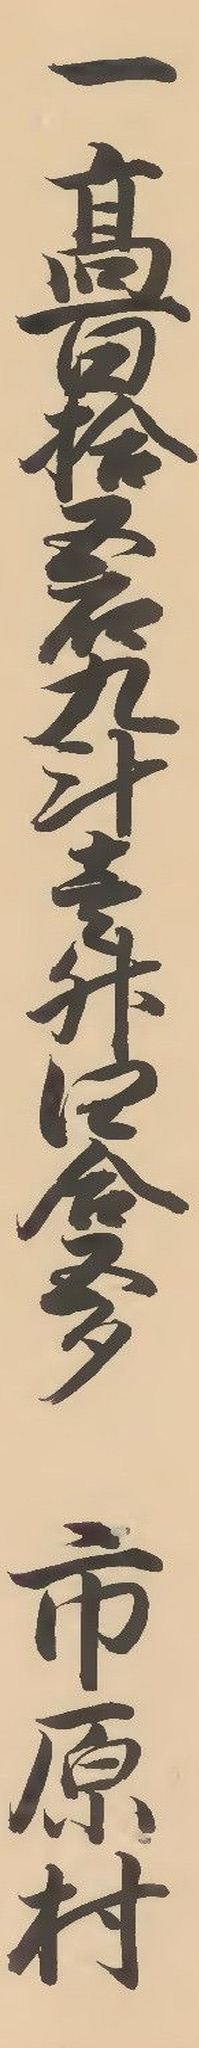一髙百拾五石九斗壱升四合五夕市原村
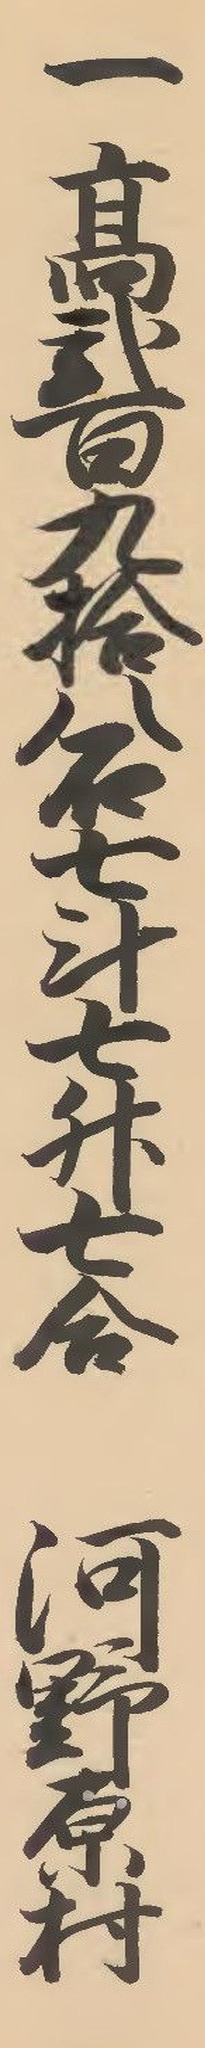一髙弐百九拾八石七斗七升七合河野原村
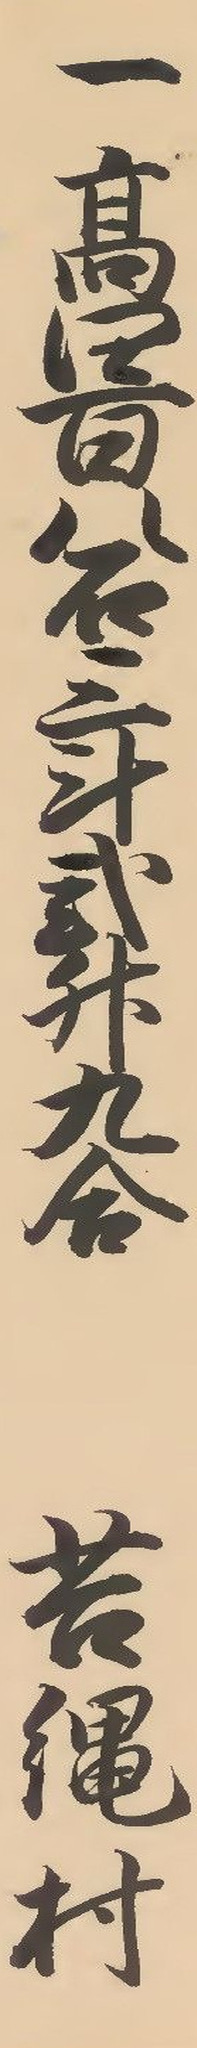一髙四百八石三斗弐升九合若縄村
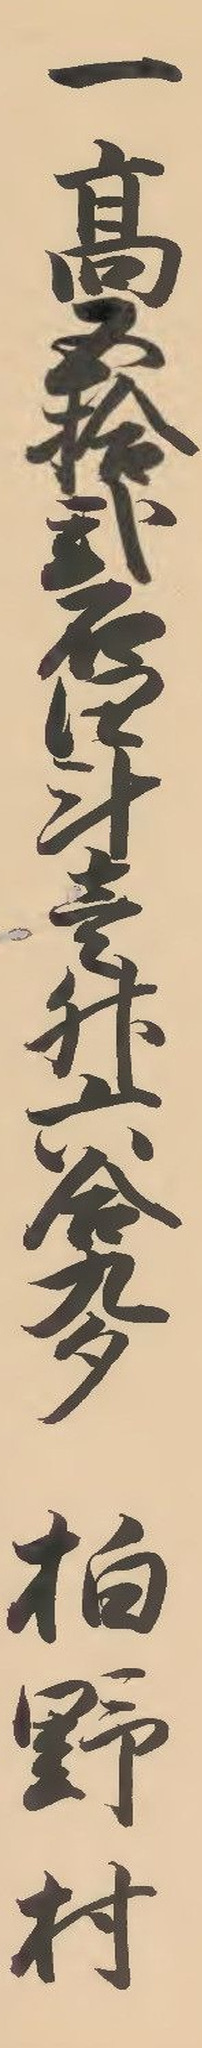一髙五拾弐石四斗壱升六合九夕柏野村
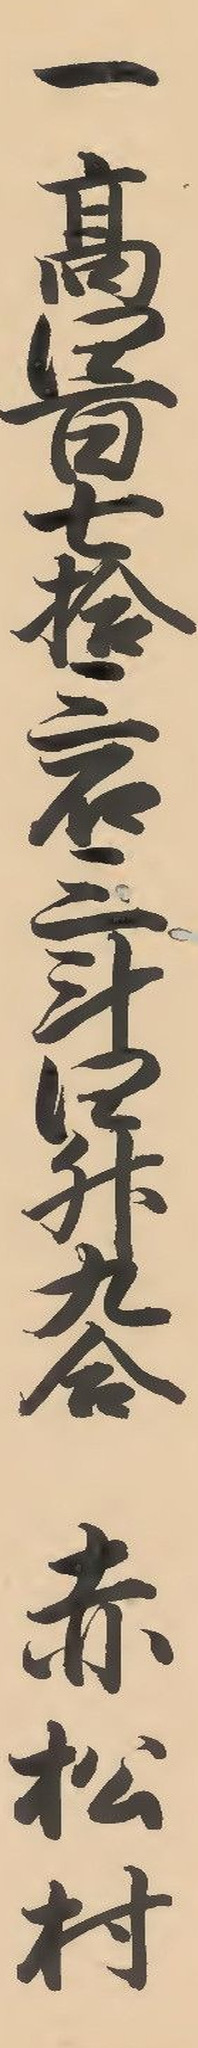一髙四百七拾三石三斗四升九合赤松村
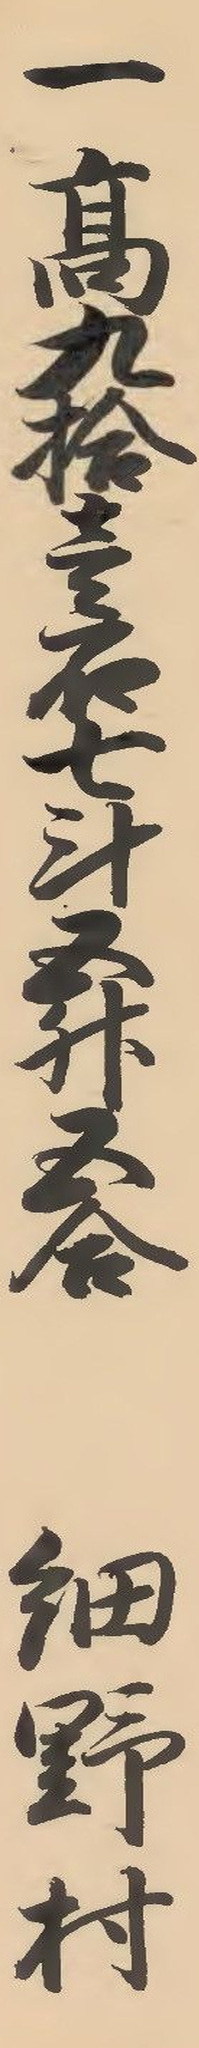一髙九拾壱石七斗五升五合細野村
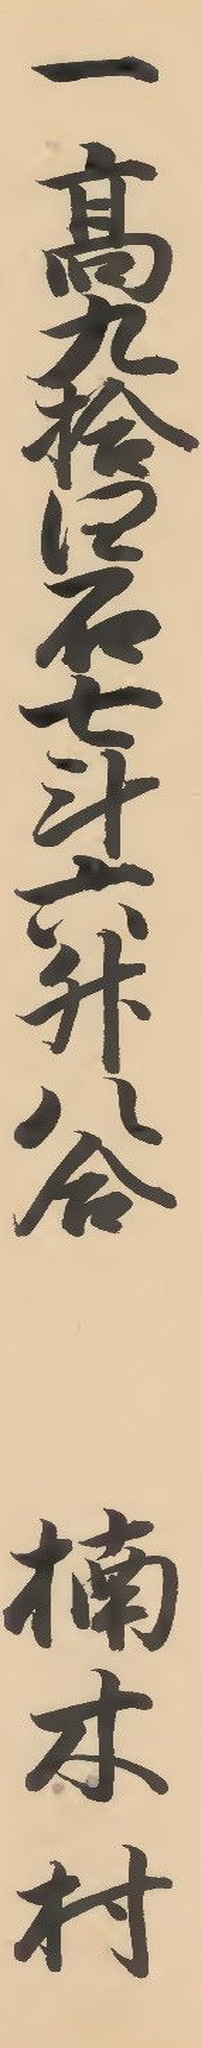一髙九拾四石七斗六升八合楠木村
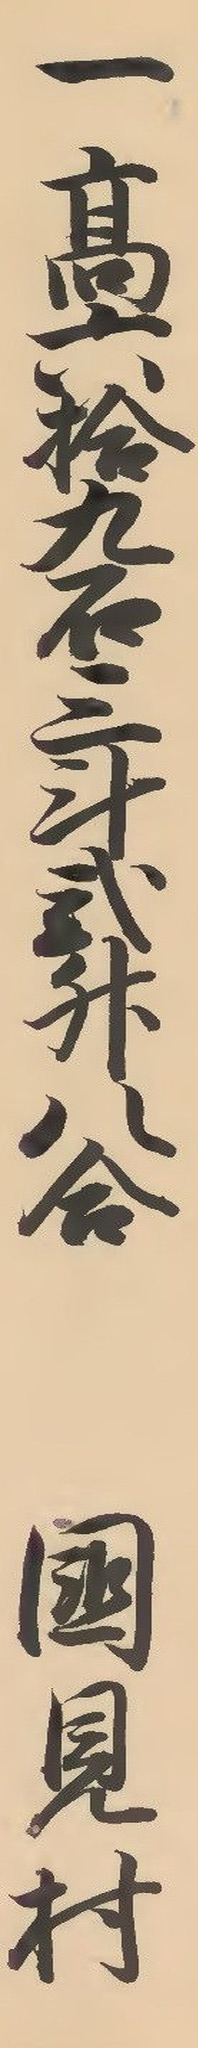一髙六拾九石三斗弐升八合國見村

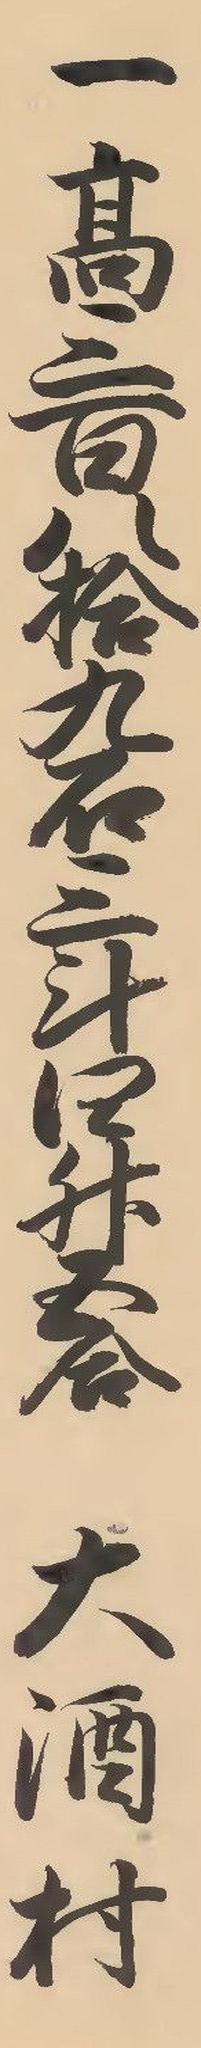一髙三百八拾九石三斗四升五合大酒村
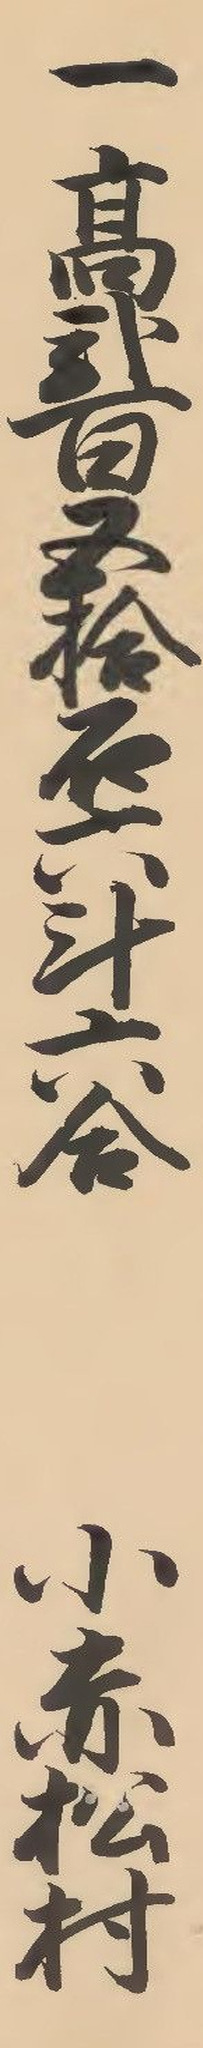一髙弐百五拾石六斗六合小赤松村
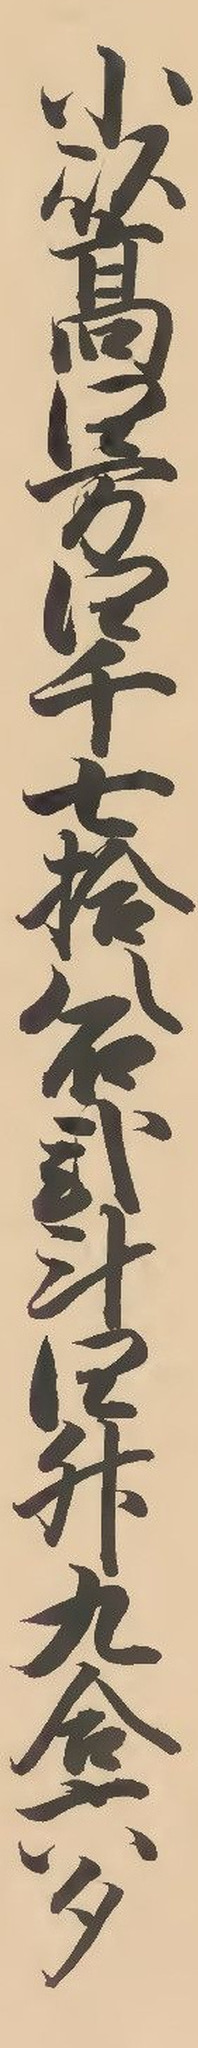小以髙四万四千七拾八石弐斗四升九合六夕
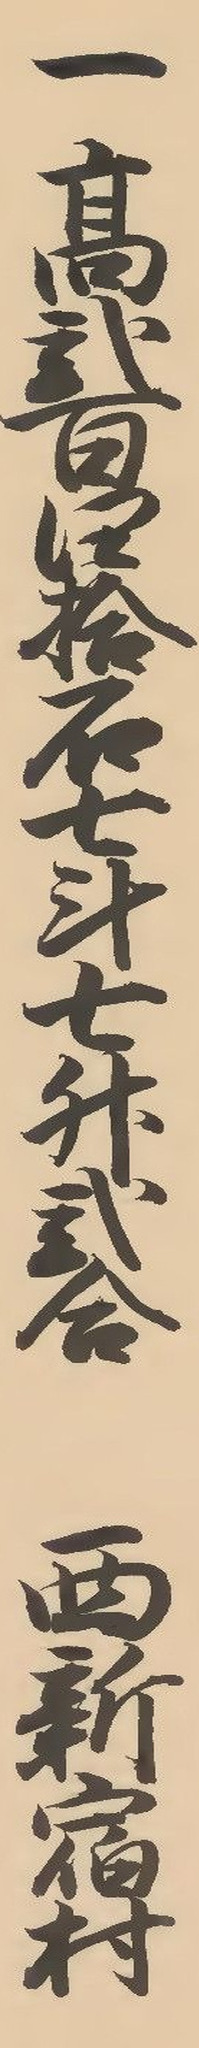一髙弐百四拾石七斗七升弐合西新宿村
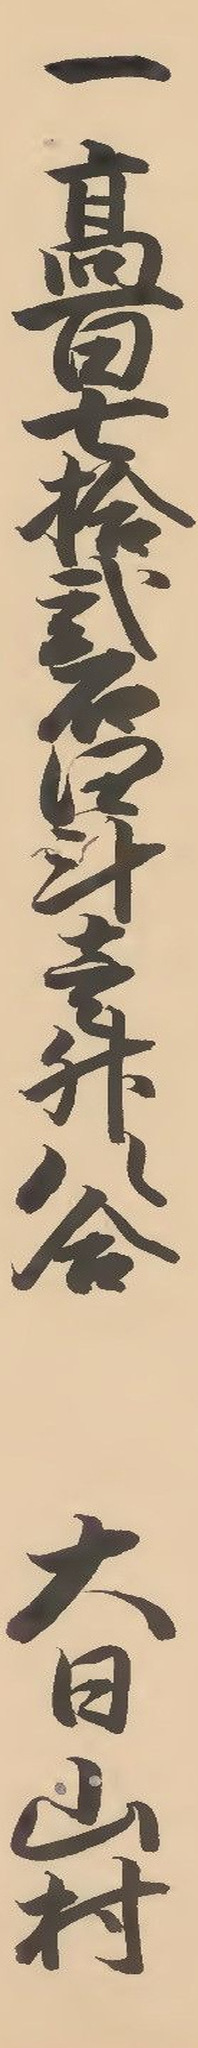一髙百七拾弐石四斗壱升八合大日山村
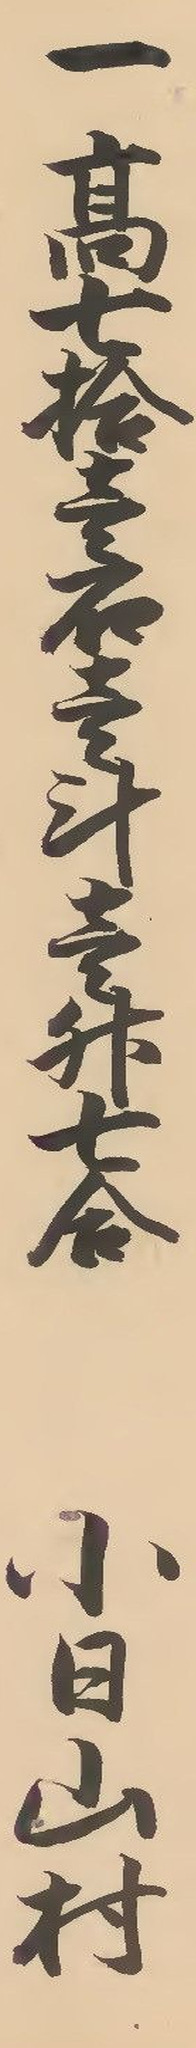一髙七拾壱石壱斗壱升七合小日山村

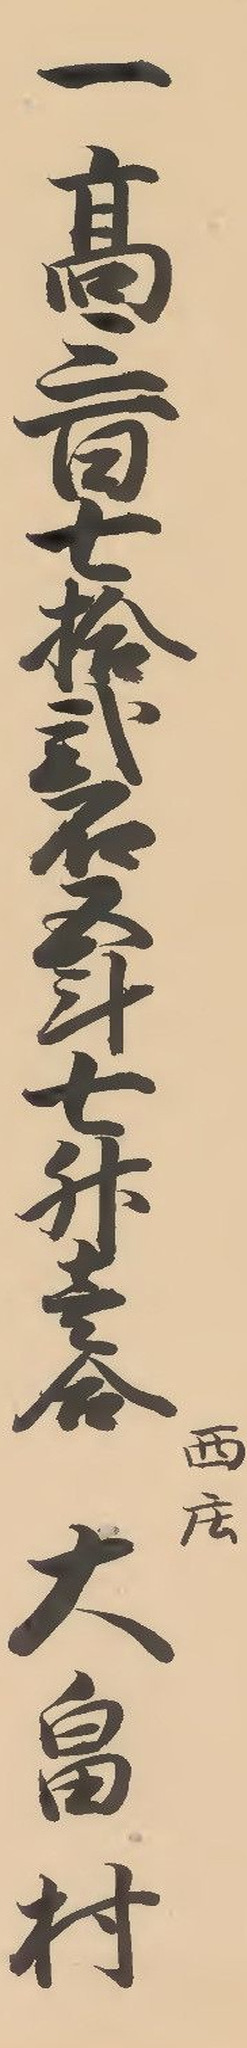一髙三百七拾弐石五斗七升壱合大畠村
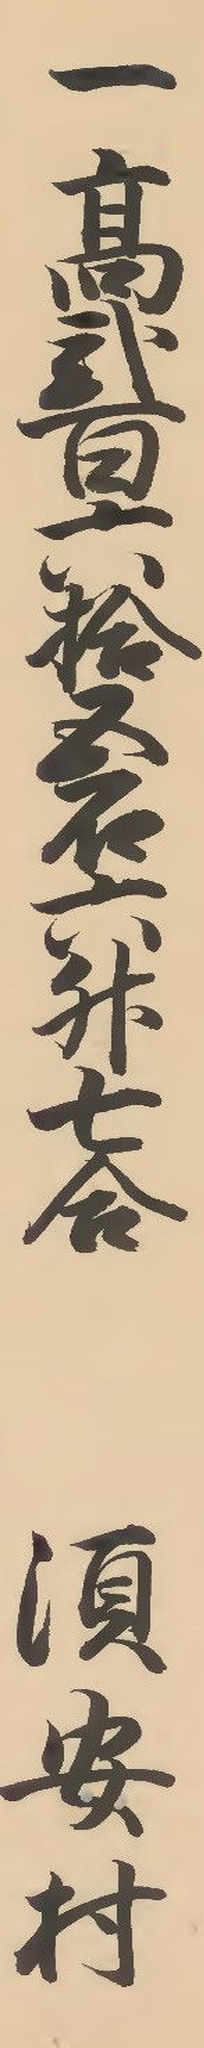一髙弐百六拾五石六斗七合須安村
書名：播磨国郷帳
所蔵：国立公文書館 National Archives of Japan
